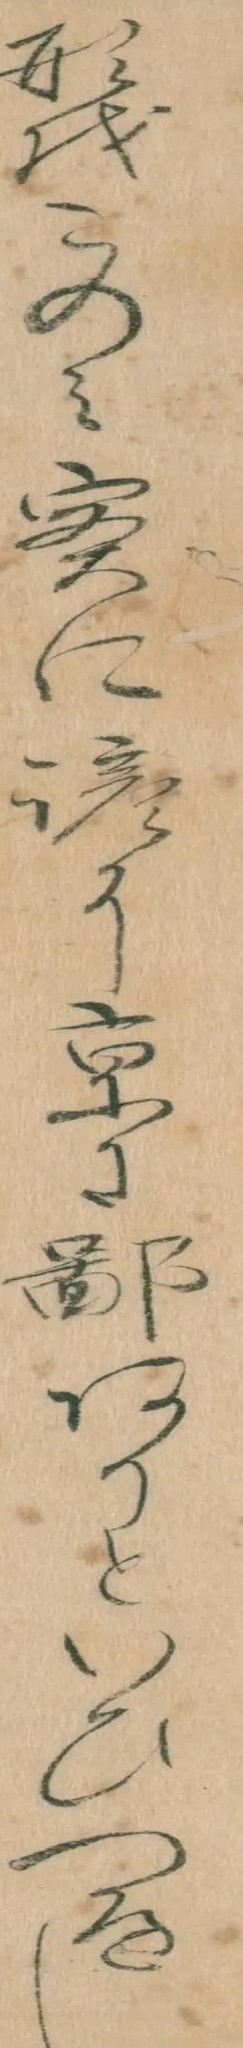形をこのみ実に諺に京に鄙ありといひつへし
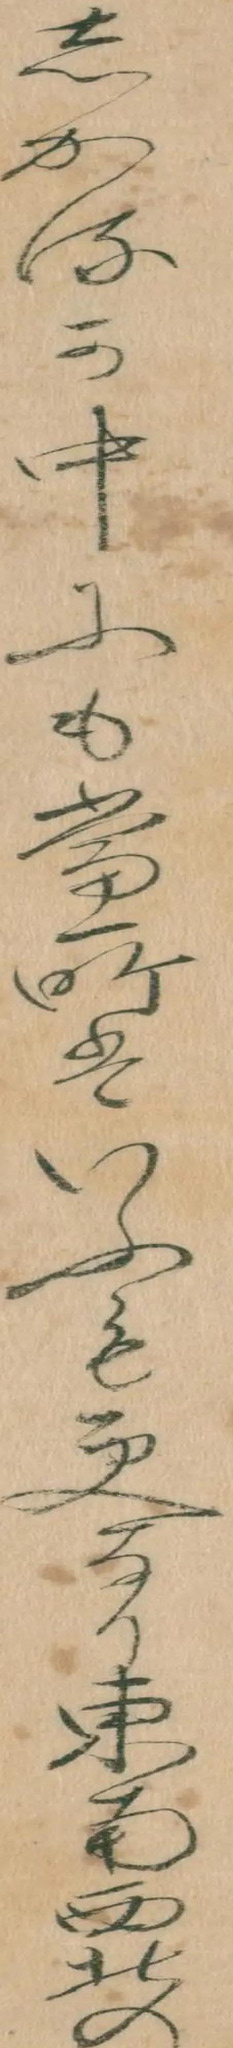しかるか中にも当所はいふも更なり東南西北の
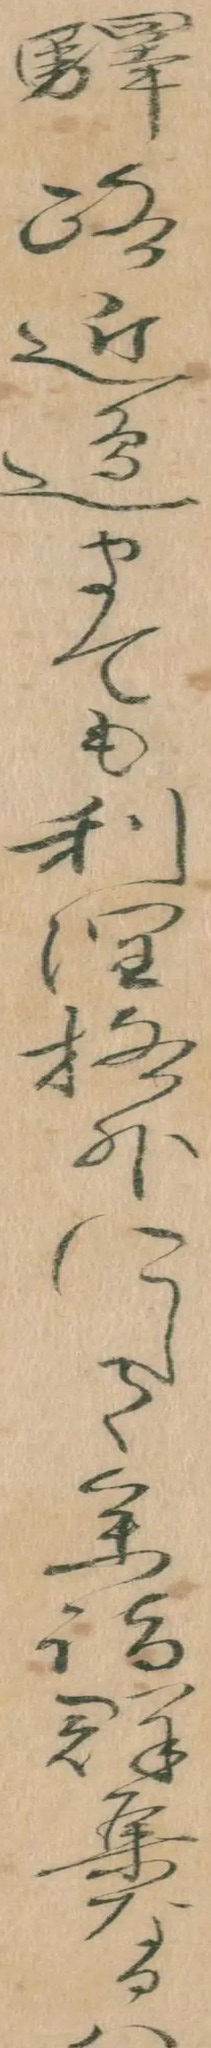駅路近辺まても利潤格外にして参詣群集なるは
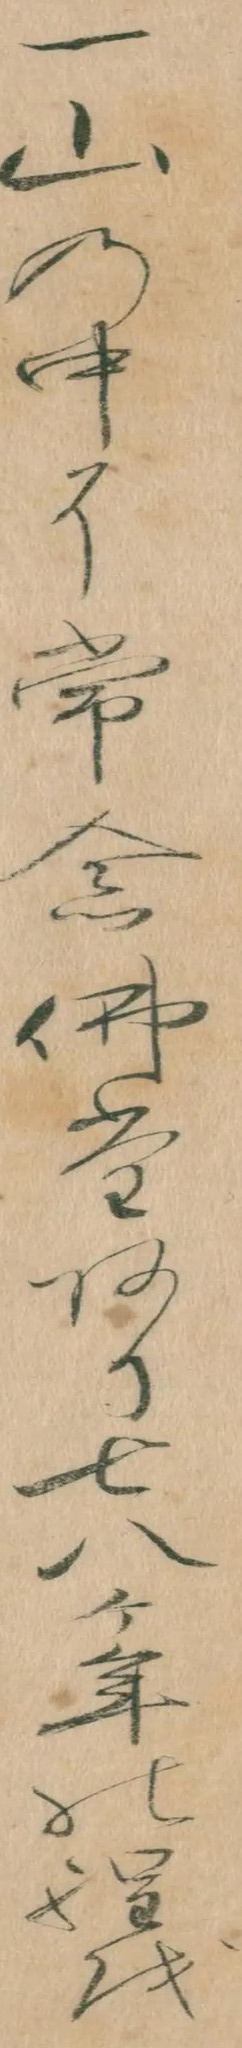一山の中に常念仏堂あり七八ヶ年の程を
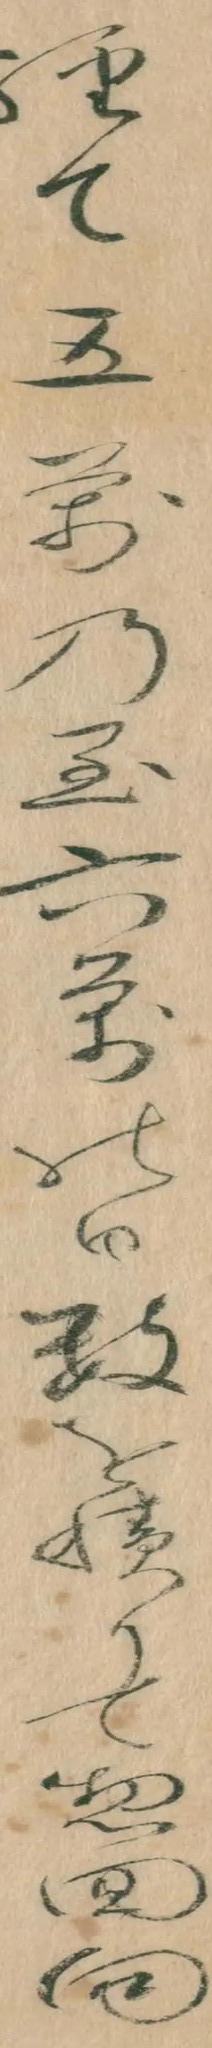経て五万乃至六万の日数を積りて惣回向
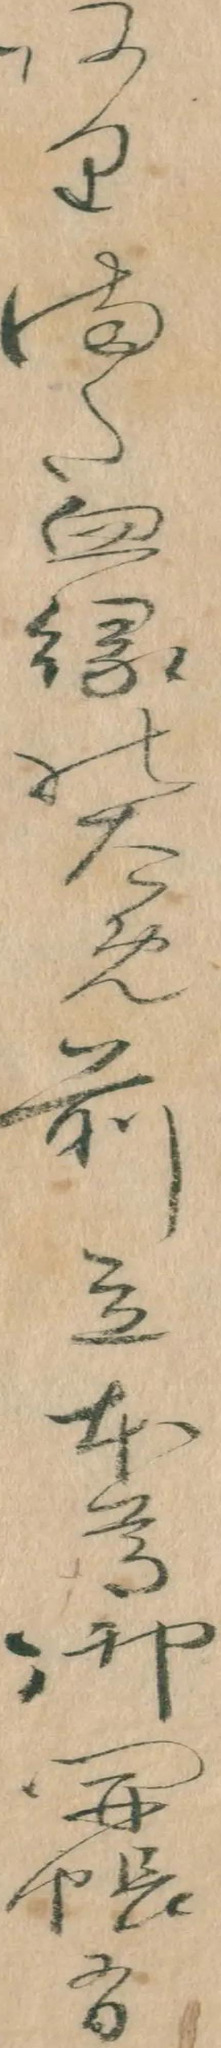ありまた血縁のため前立本尊御開帳にり
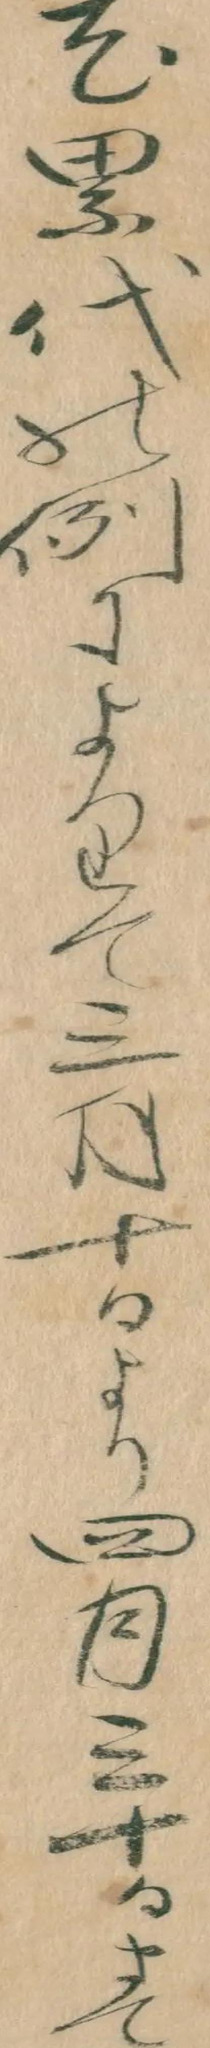尤累代の例によりて三月十日より四月三十日まて
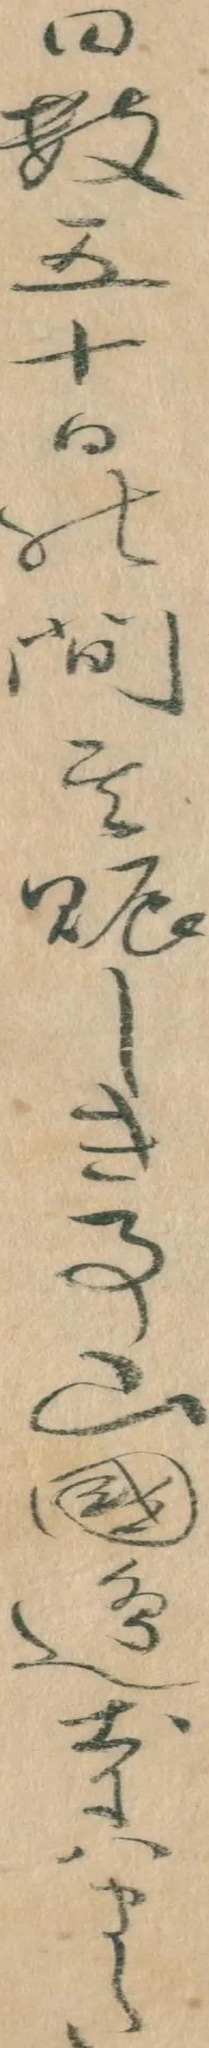日数五十日の間其賑しき事山国辺にはまた
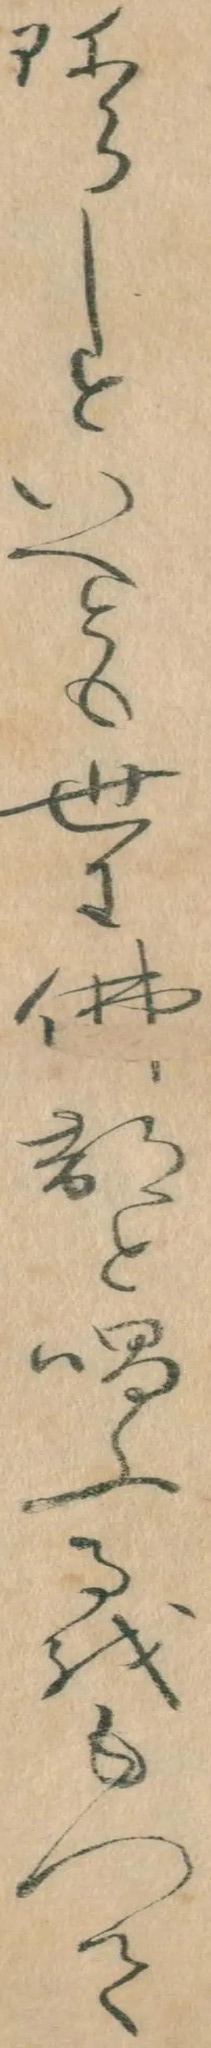珍らしといへとも世に仏都と唱ふるをもつて
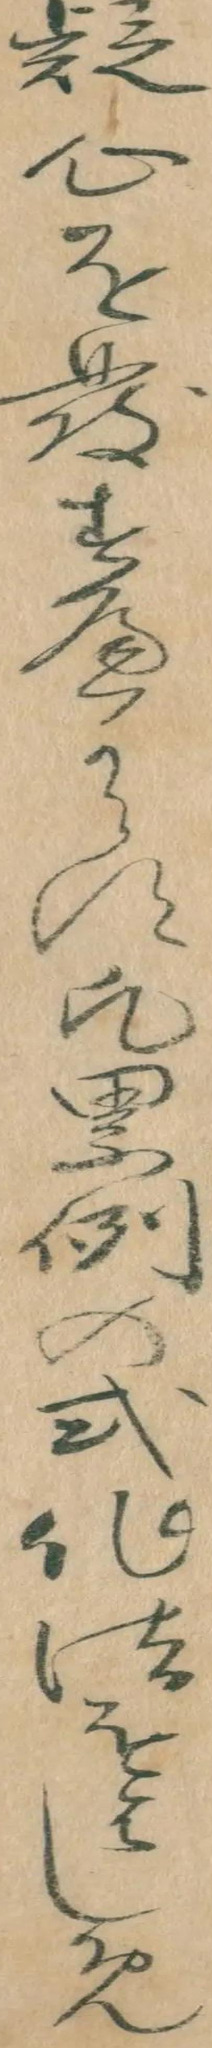疑心を発すへからす凡累例の式作法をはしめ

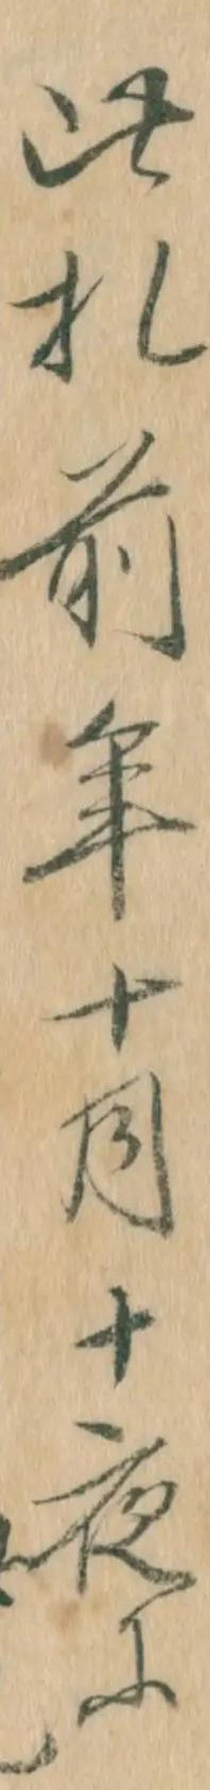此前年十月十夜に
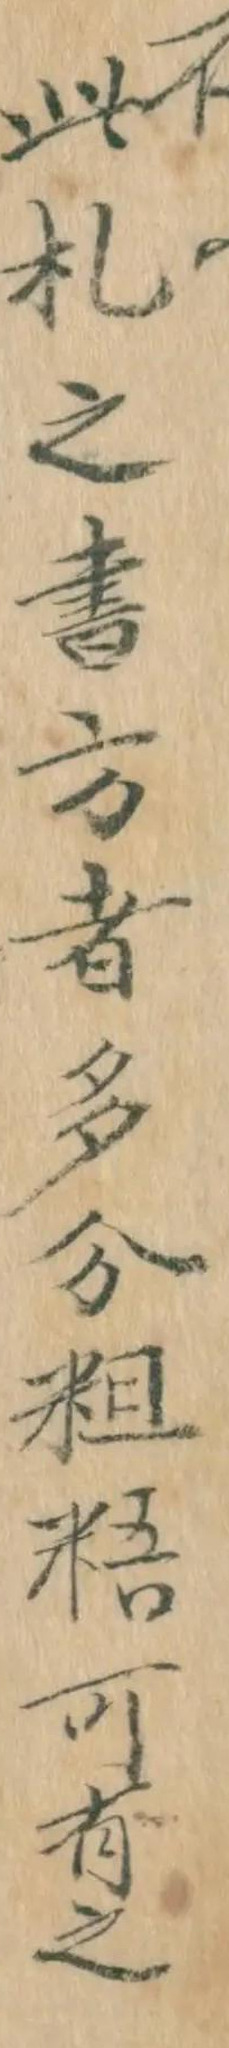此札之書方者多分粗可有之
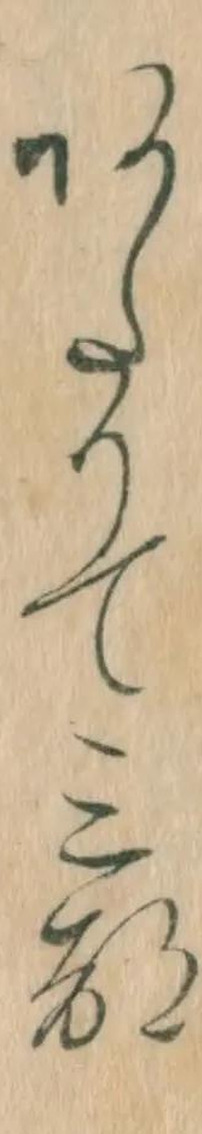あたりて三都
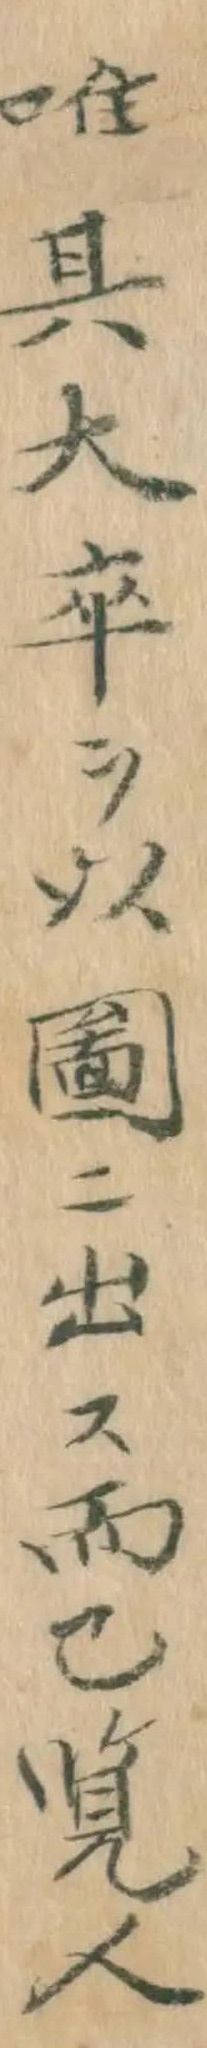唯其大卒を以図に出す而也覧人
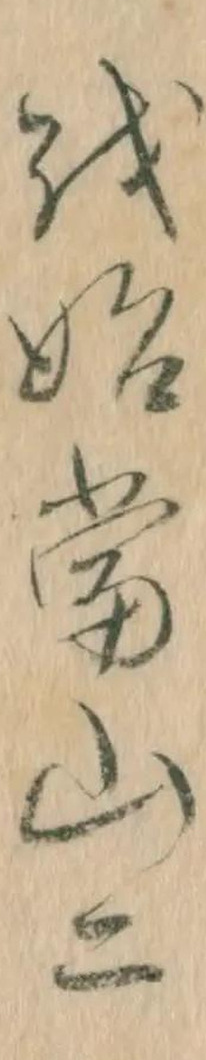を始当山二
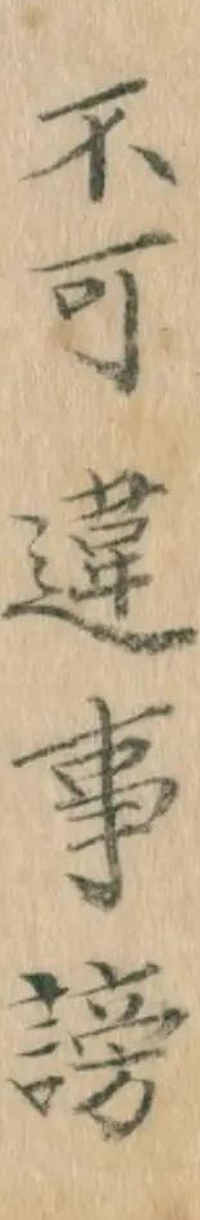不可違事謗
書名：俗語之種. [1]
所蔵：国立国会図書館 National Diet Library, JAPAN
